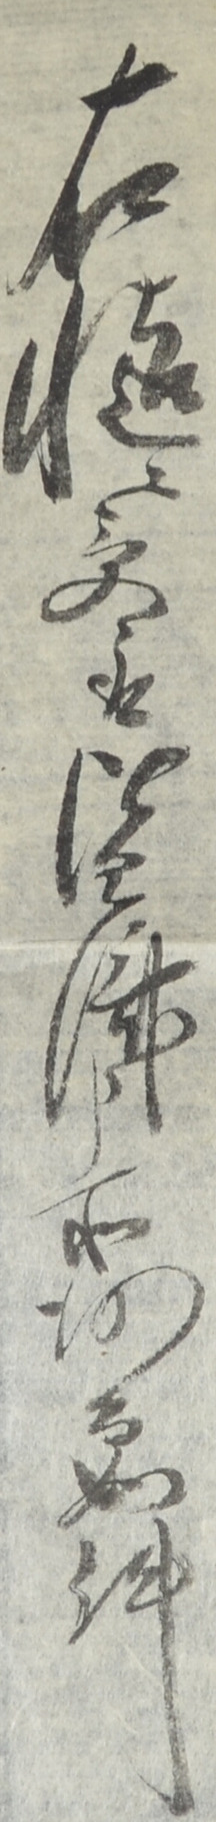右慥ニ受取皆済申所仍如件
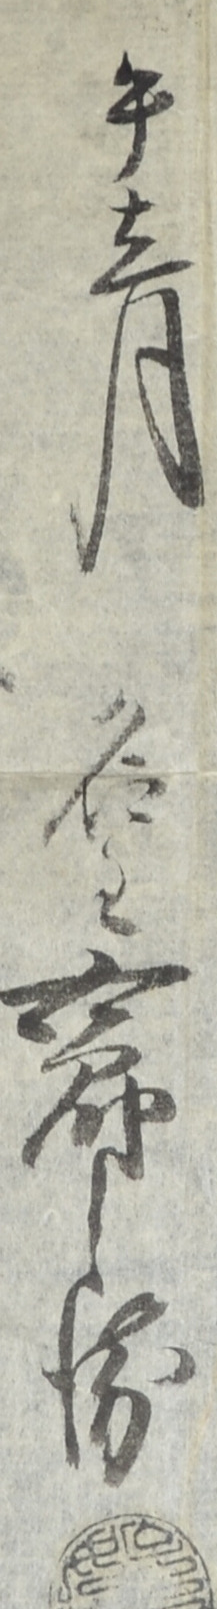午十二月名主五郎兵衛㊞
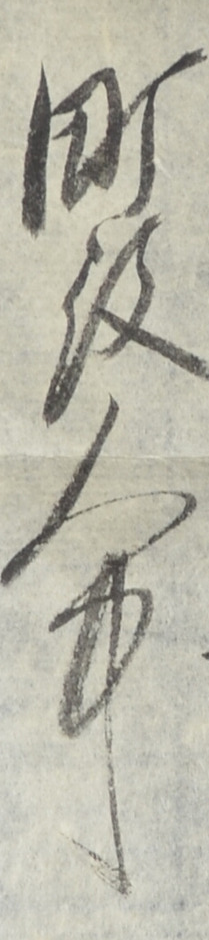町役人中

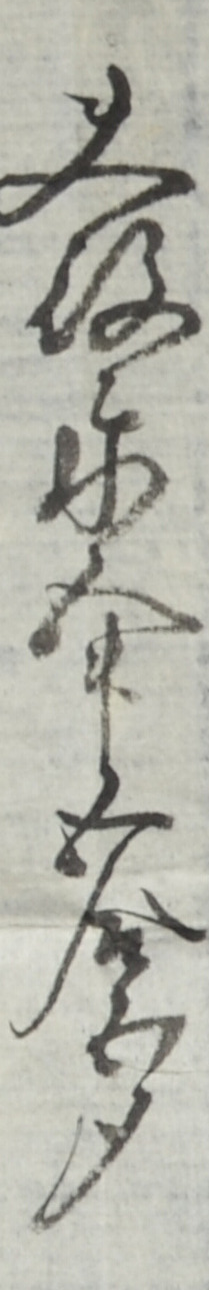夫役米五升五合五勺
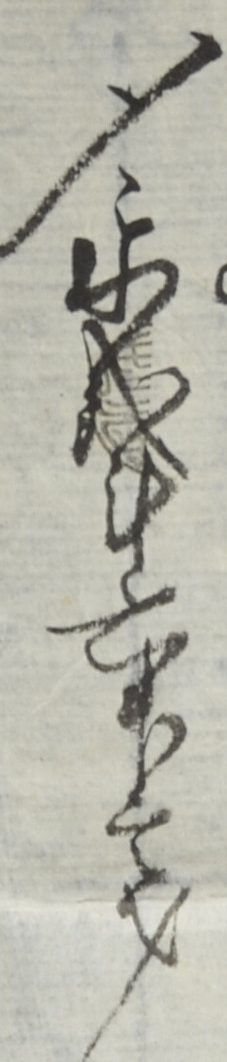〆米弐斗六升壱才
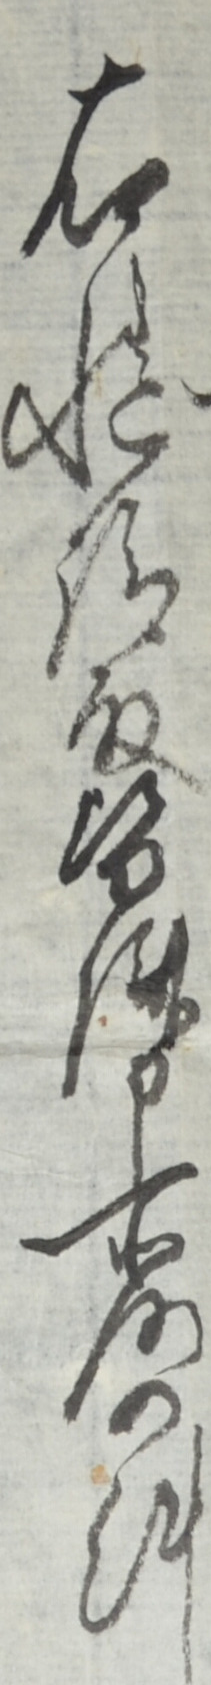右慥請取皆済申所仍如件
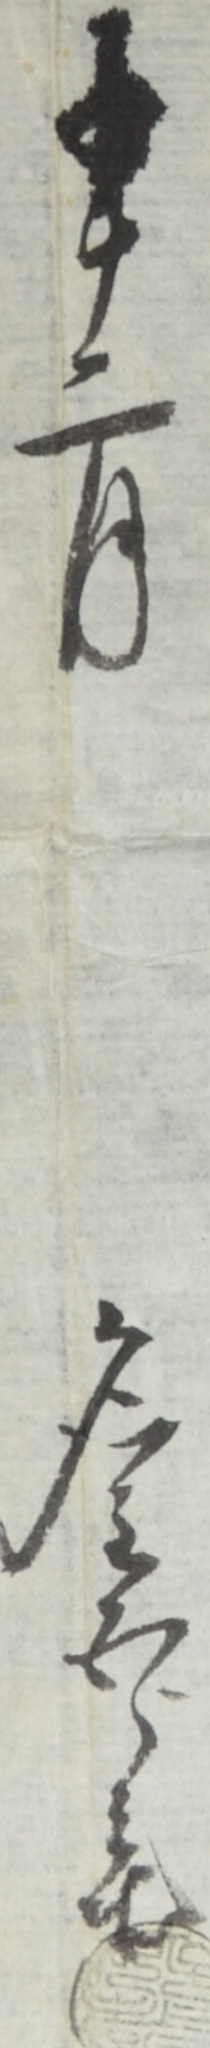子十二月名主五郎兵衛㊞
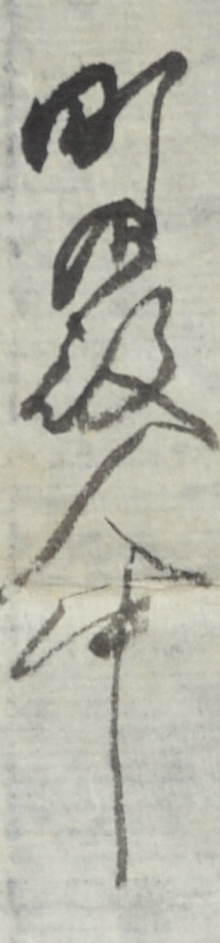町御役人中

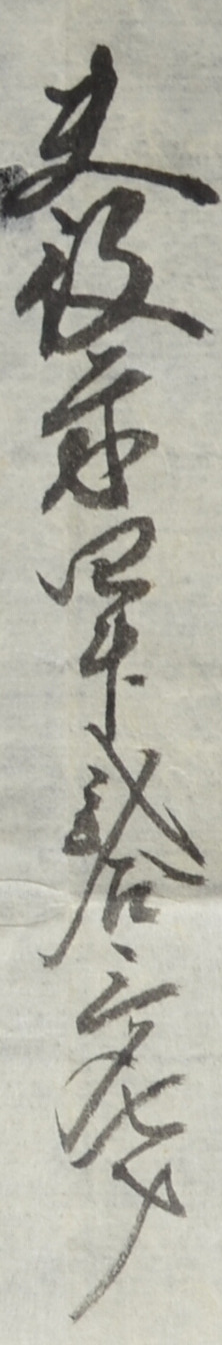夫役米四升弐合三勺七才
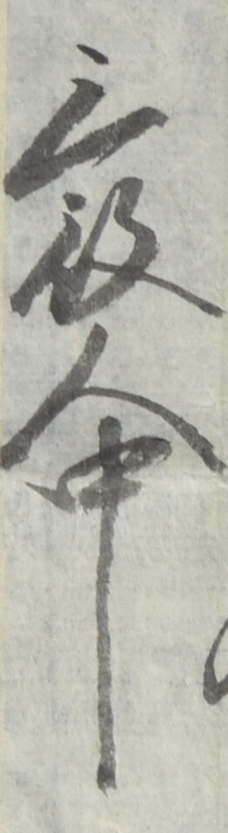三役人中

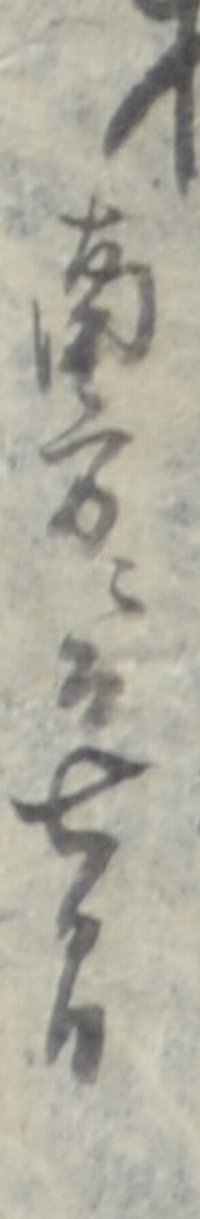南方ニ而七間
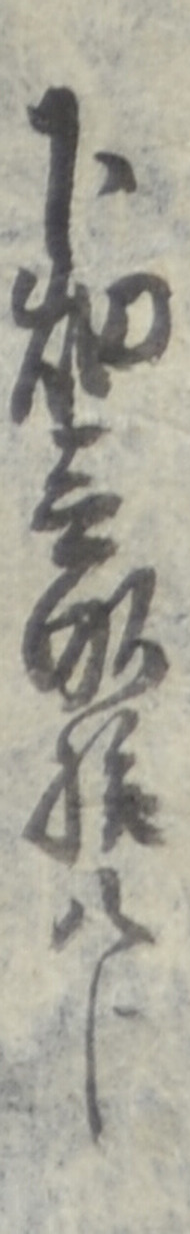下畑壱畝拾八分
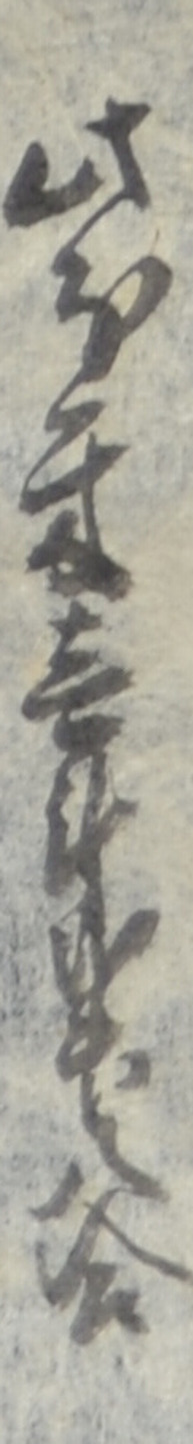此分米壱斗弐升八合
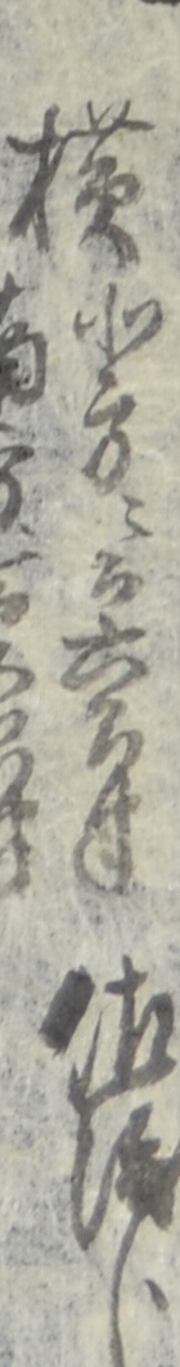横北方ニ而六間半佐衛分
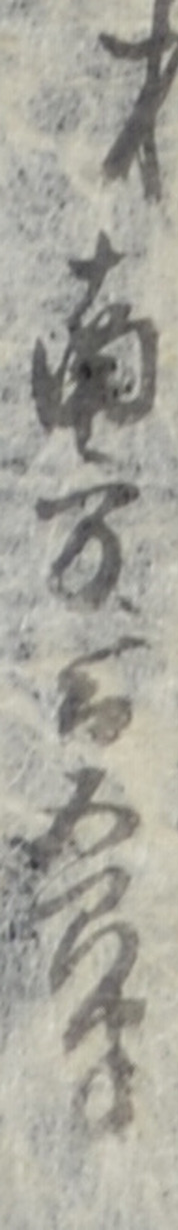南方ニ而五間半
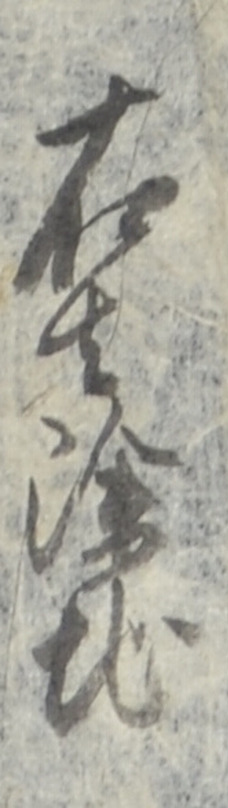右者除地
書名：鉾持村皆済権現道附替畝歩書付
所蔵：伊那市立高遠町図書館・合同会社AMANE
